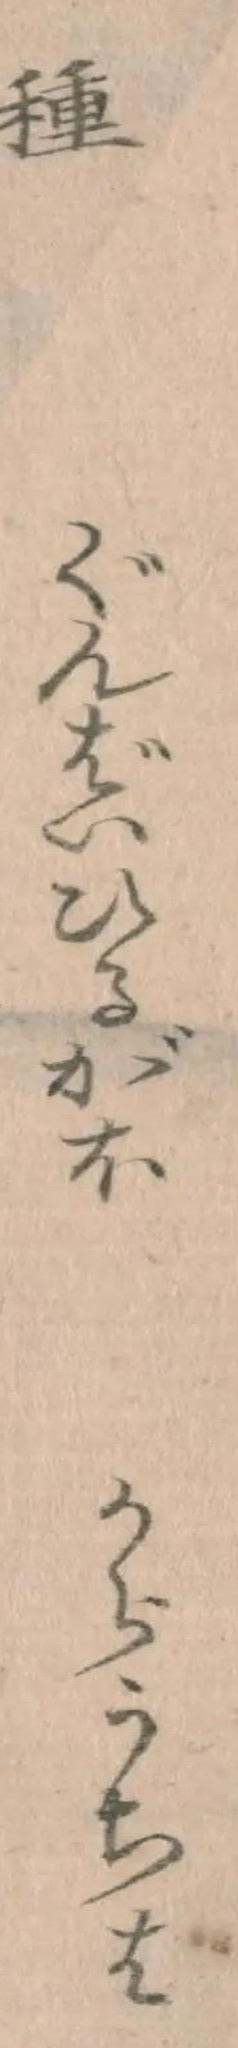一種ぐんばいひるがほからうちは
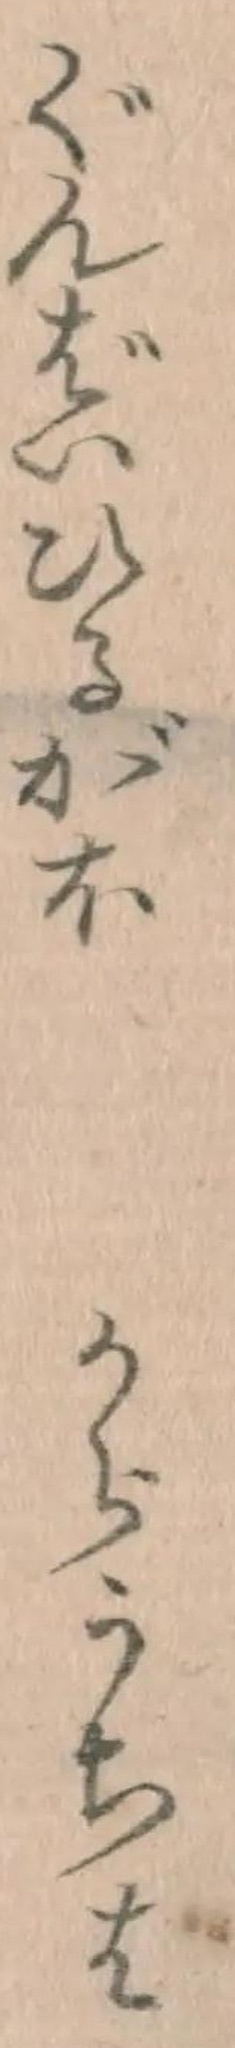一種ぐんばいひるがほからうちは
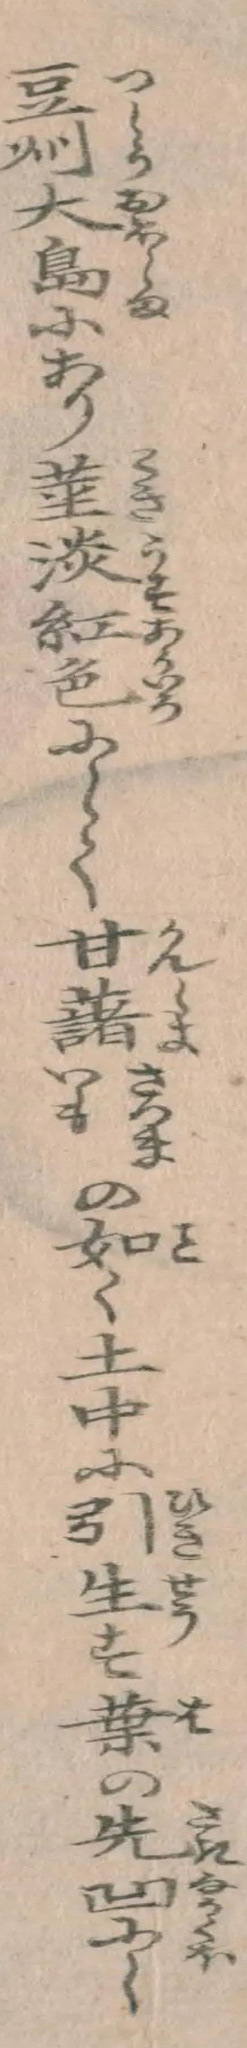豆州大島にあり茎淡紅色にして甘藷さつまいもの如く土中に引生す葉の先凹にし
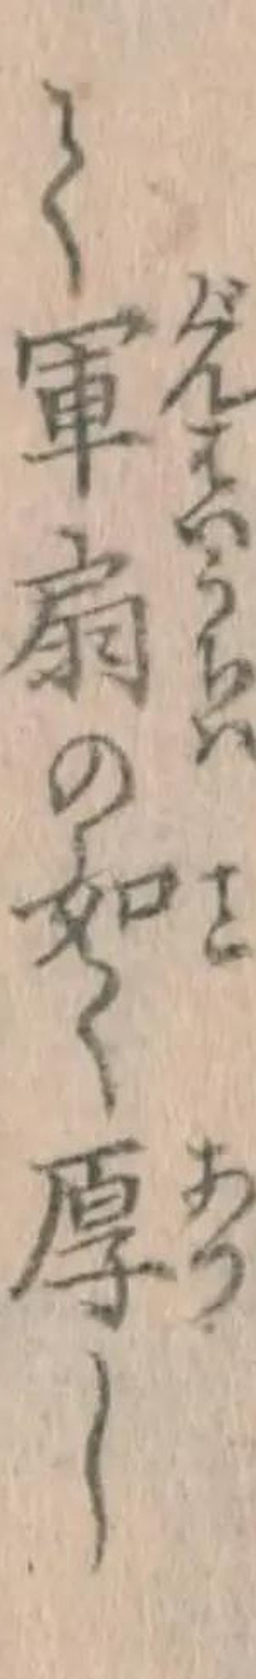て軍扇の如く厚し

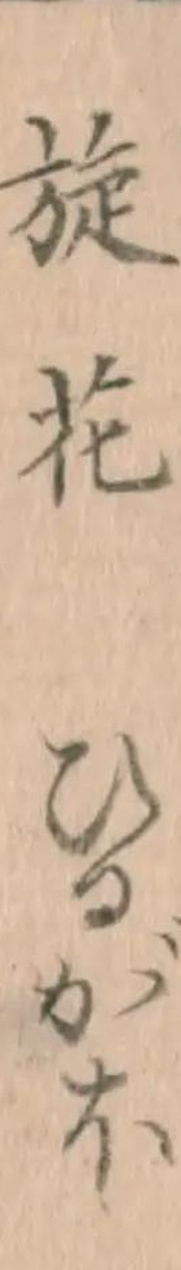旋花ひるがほ
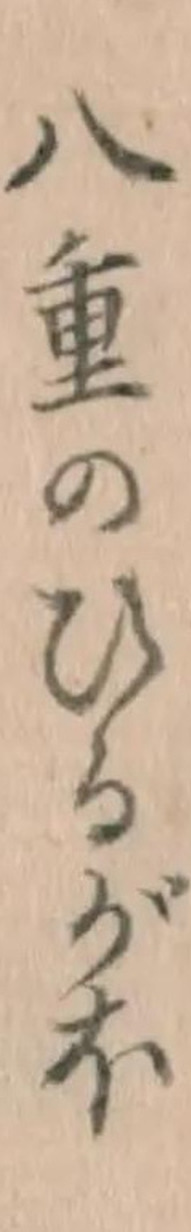八重のひるがほ
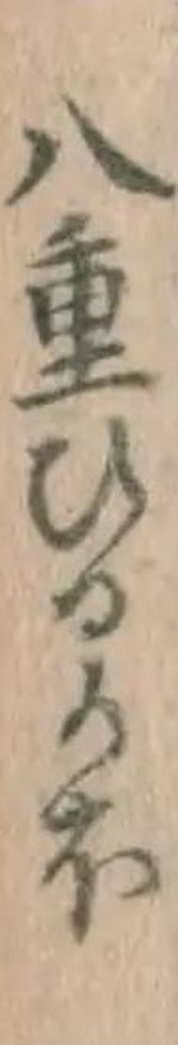八重ひるかほ

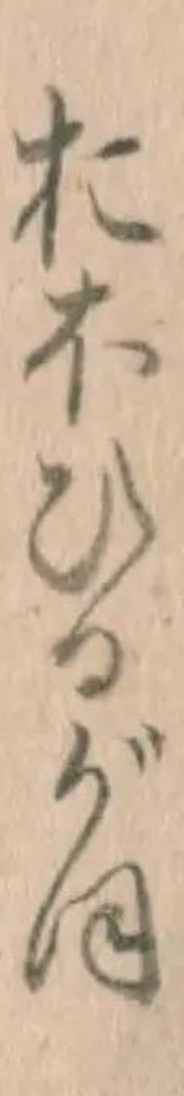おほひるがほ
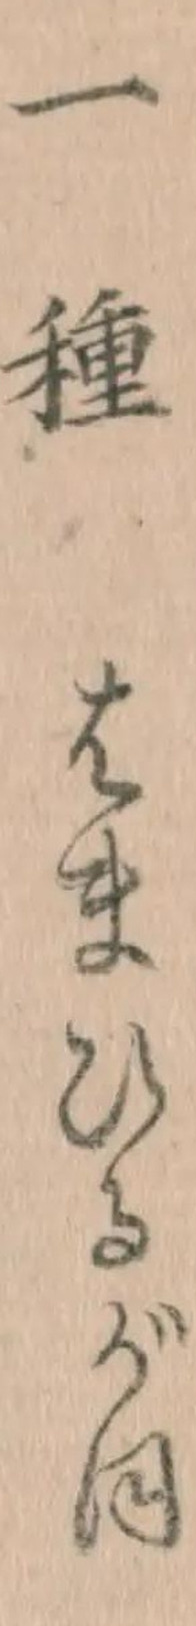一種はまひるがほ
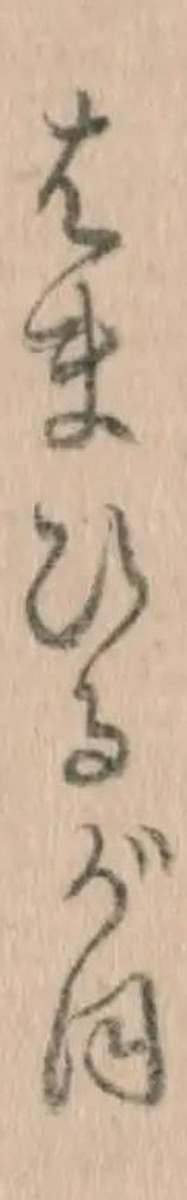はまひるかほ
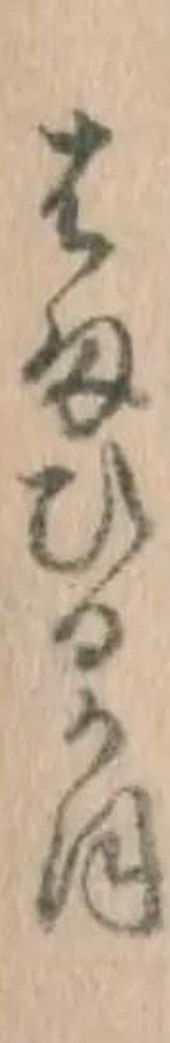はまひるかほ

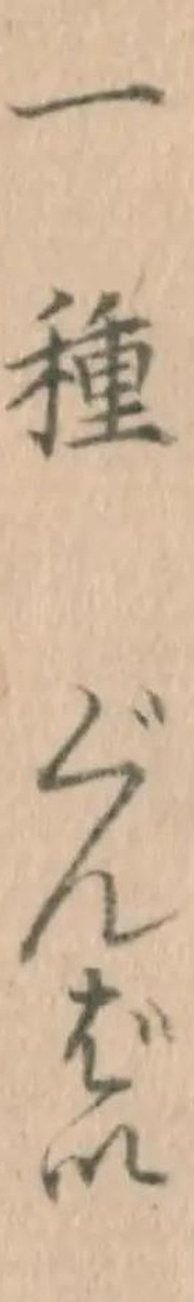一種ぐんばい
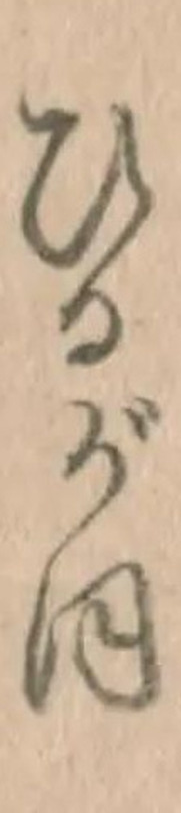ひるがほ
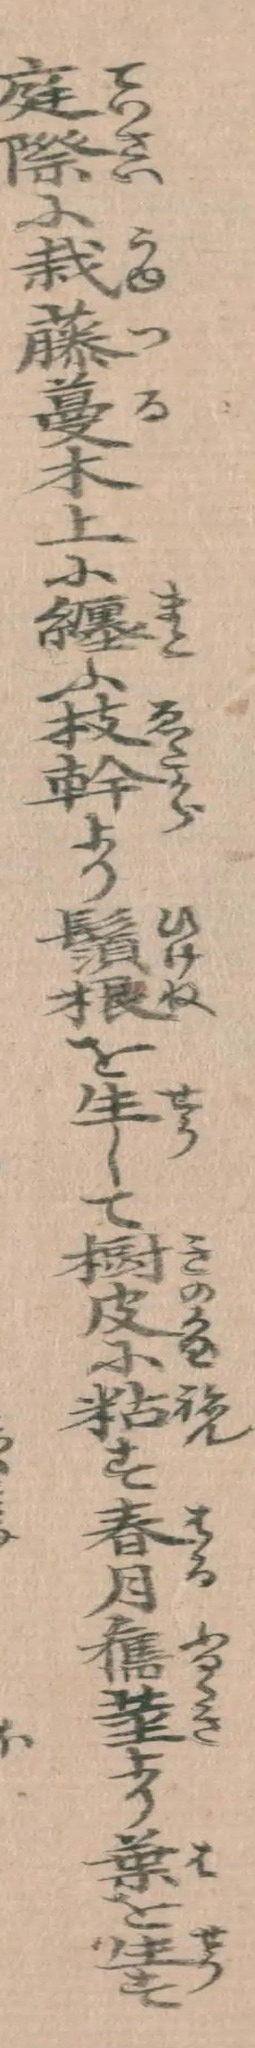庭際に栽藤蔓木上に纏ふ枝幹より鬚根を生して樹皮に粘す春月旧茎より葉を生す
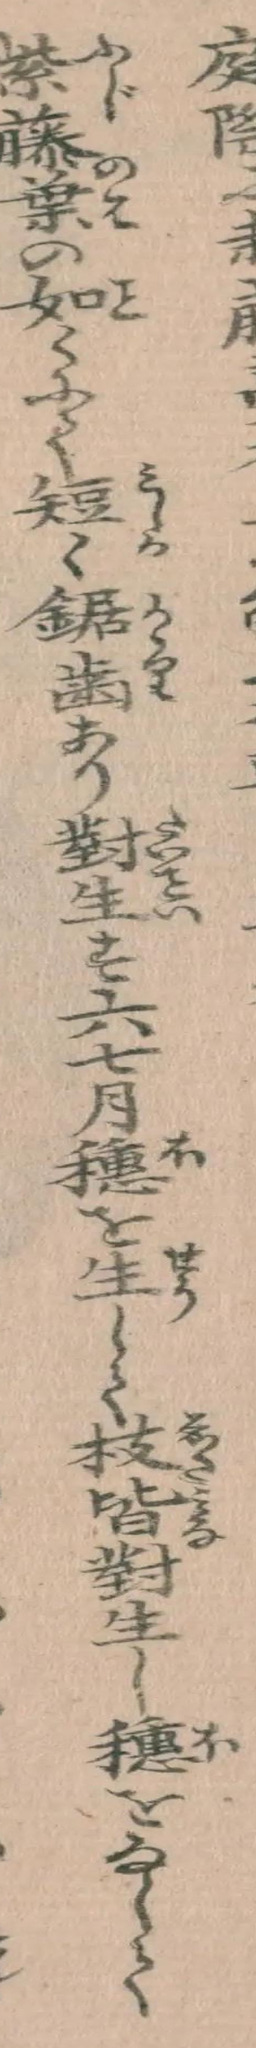紫藤葉の如くにて短く鋸歯あり対生す六七月穂を生して枝皆対生し穂をなして
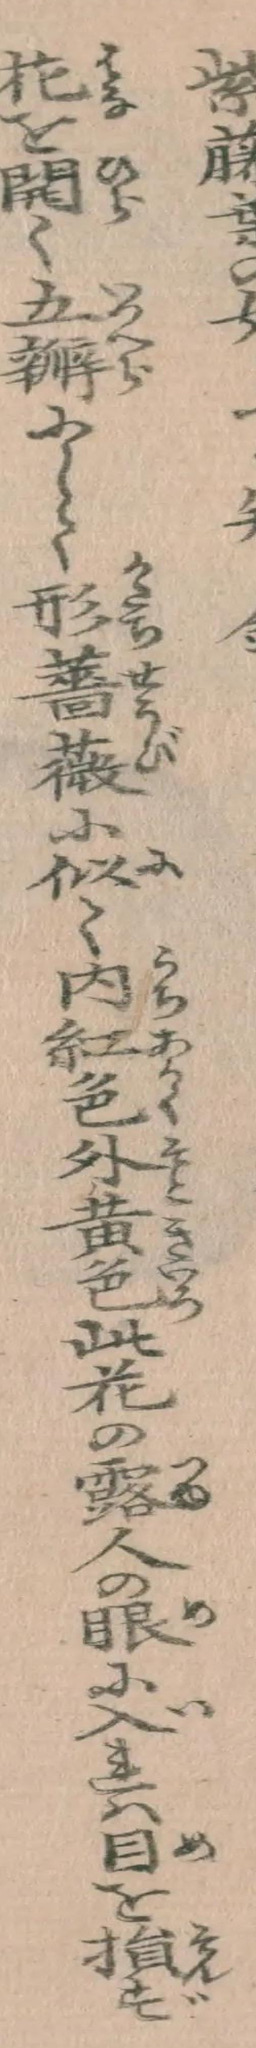花を開く五弁にして形薔薇に似て内紅色外黄色此花の露人の眼に入れは目を損ず
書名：本草図譜. 巻25-27
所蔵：国立国会図書館 National Diet Library, JAPAN
